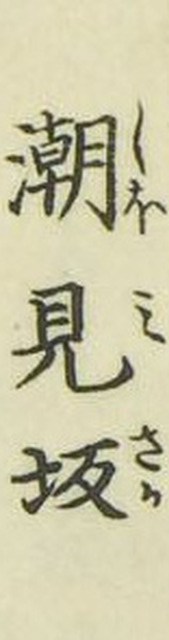潮見坂
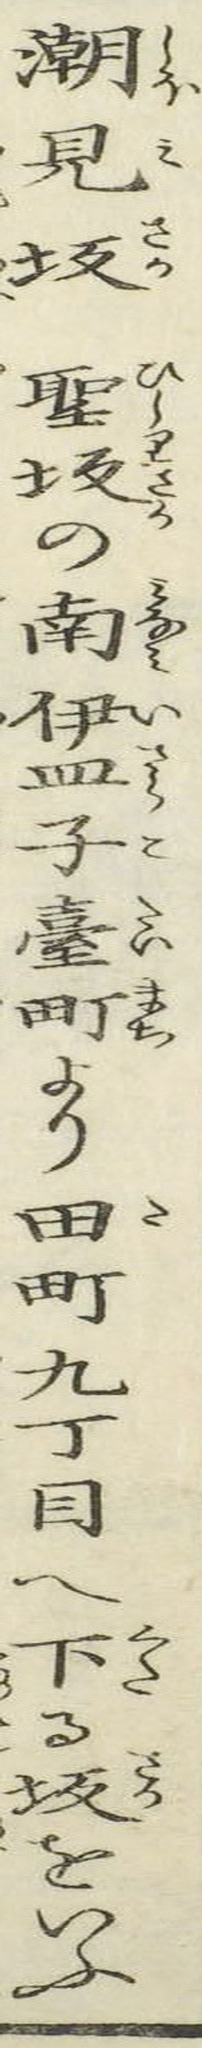潮見坂聖坂の南伊皿子臺町より田町九丁目へ下る坂をいふ
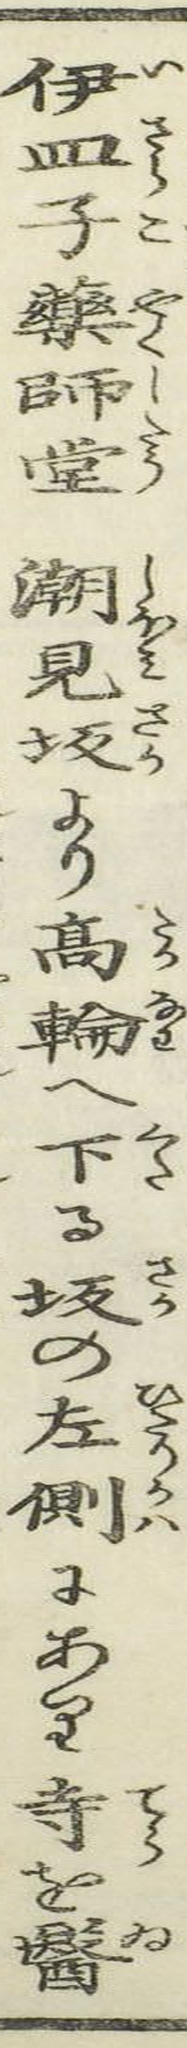伊皿子薬師堂潮見坂より高輪へ下る坂の左側にあり寺を醫
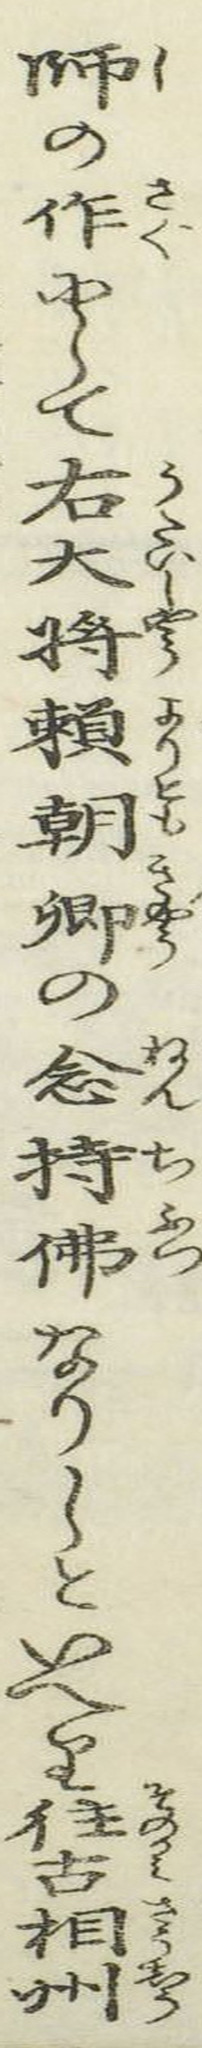師の作にして右大将頼朝卿の念持佛なりしといへり往古相州
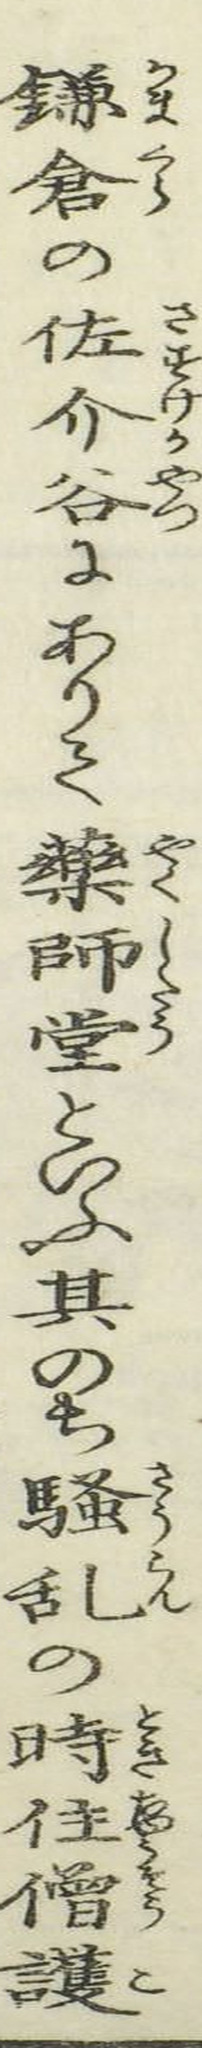鎌倉の佐介谷にありて薬師堂といふ其のち騒乱の時住僧護
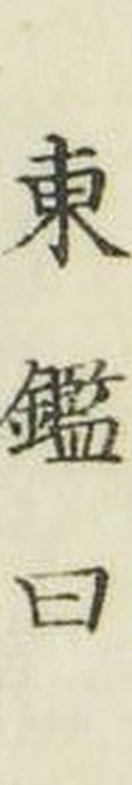東鑑曰
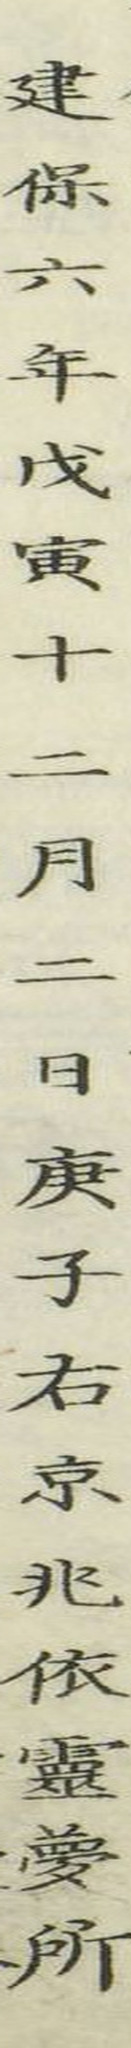建保六年戊寅十二月二日庚子右京兆依霊夢所
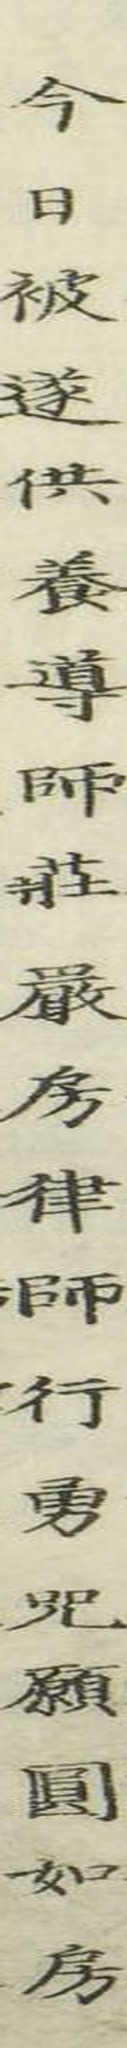今日被遂供養導師荘厳房律師行勇咒願圓如房

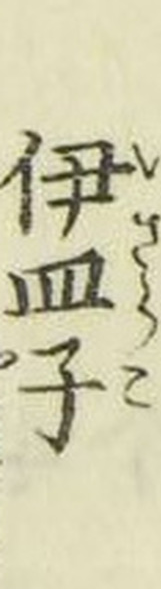伊皿子
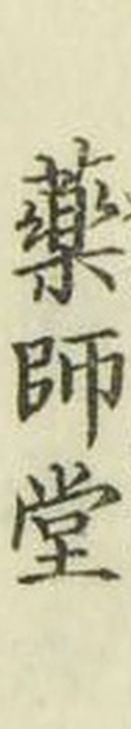薬師堂
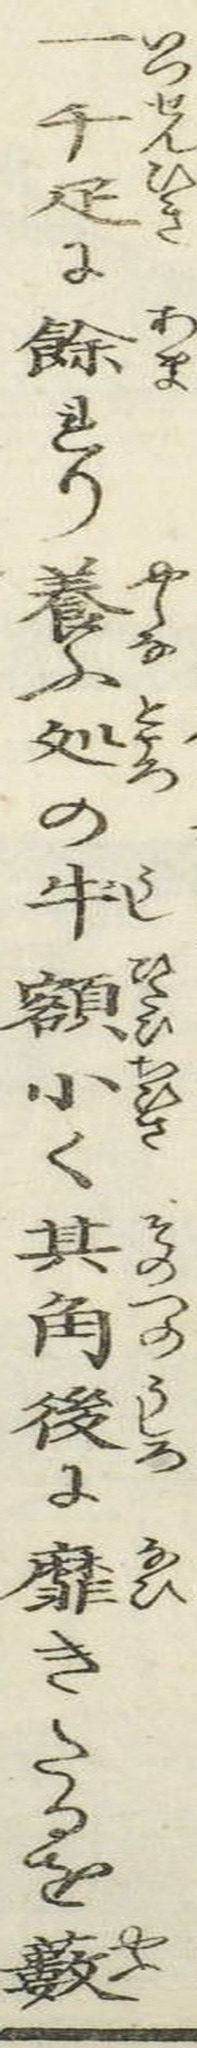一千疋に餘れり養ふ処の牛額小く其角後に靡きたるを藪
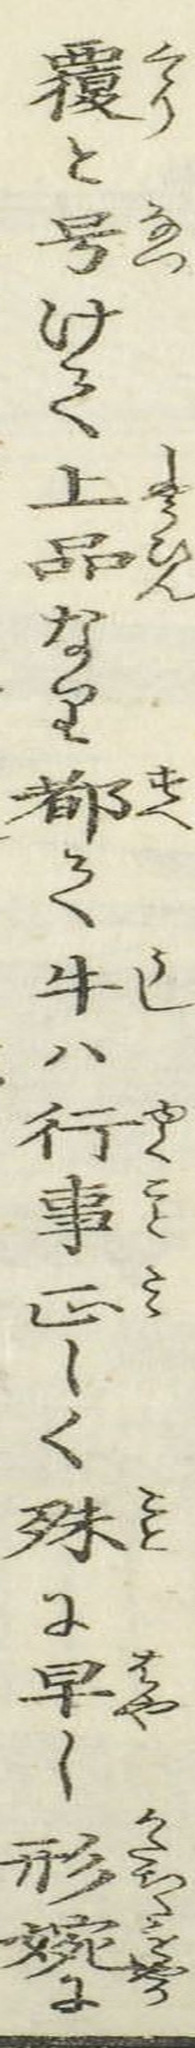覆と号けて上品なり都て牛は行事正しく殊に早し形婉に
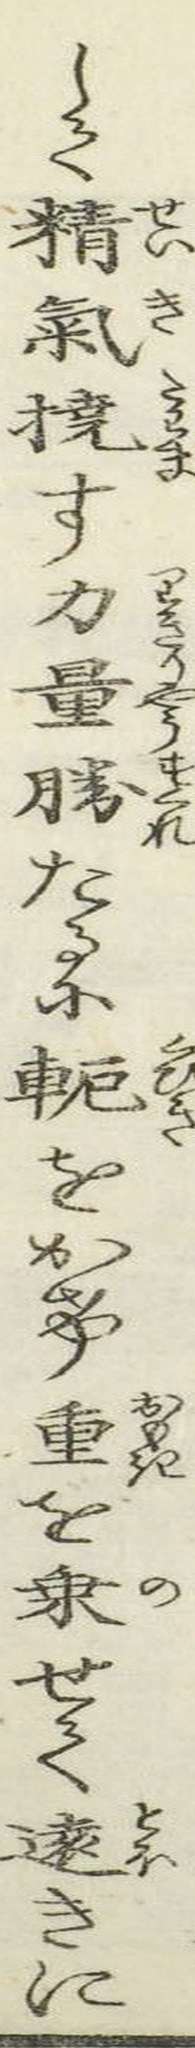して精氣撓す力量勝たるに軛をかけ重を乗せて遠きに
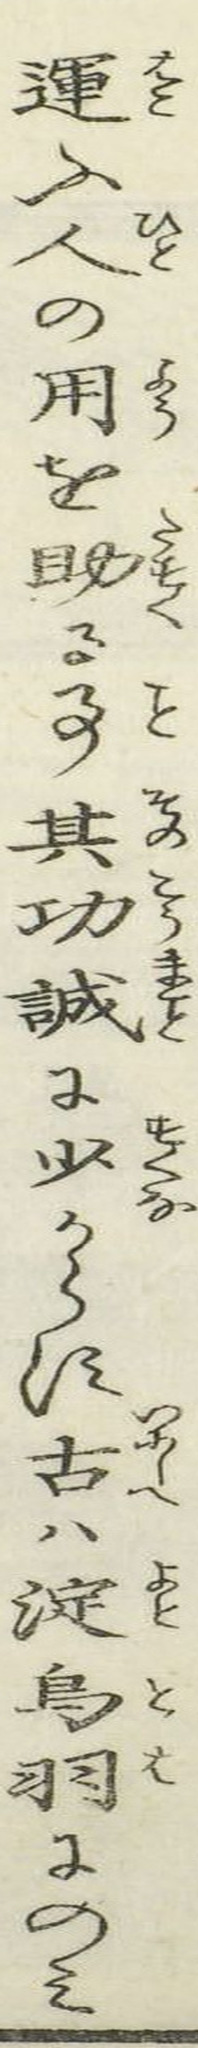運ふ人の用を助る事其功誠に少からす古は淀鳥羽にのみ
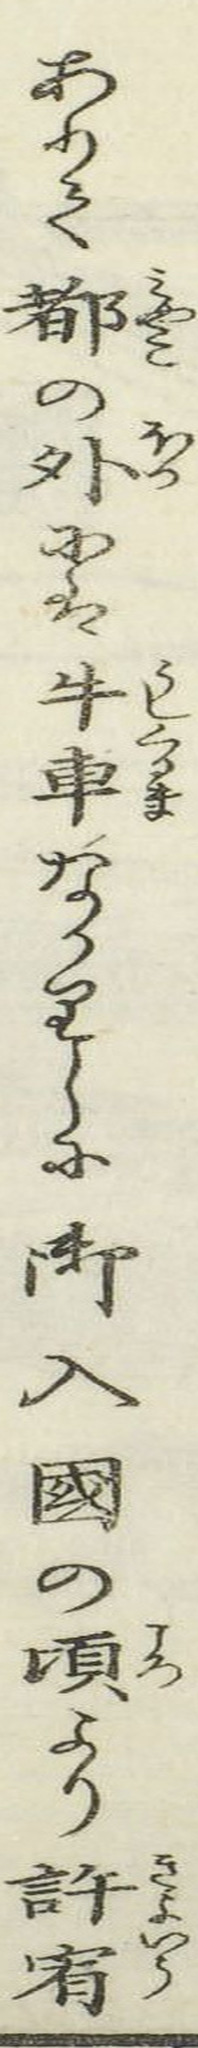ありて都の外には牛車なかりしに御入國の頃より許宥
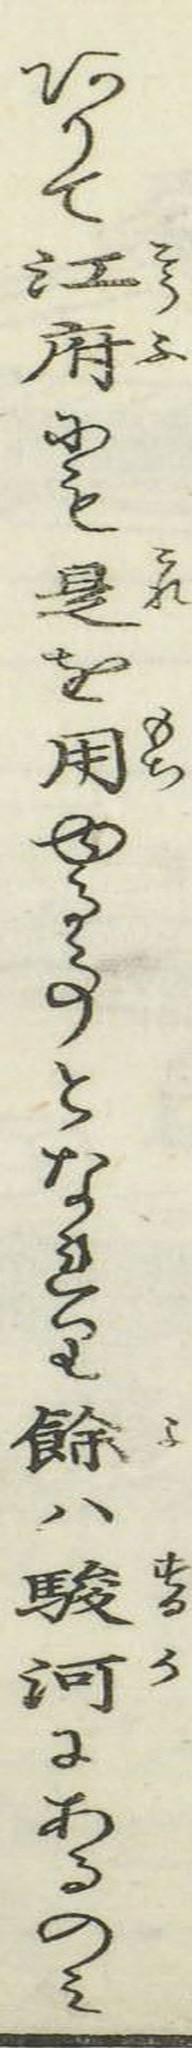ありて江府にも是を用ゆる事となれり餘は駿河にあるのみ
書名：江戸名所図会 20巻 巻之3
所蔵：東京学芸大学教育コンテンツアーカイブ
